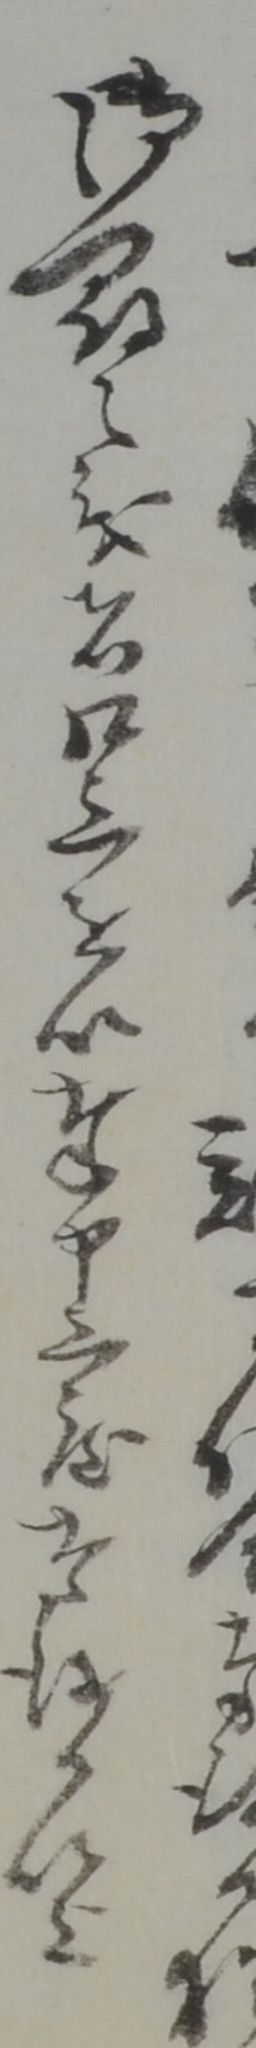御尋之義者口上を以奉申上度奉存候以上
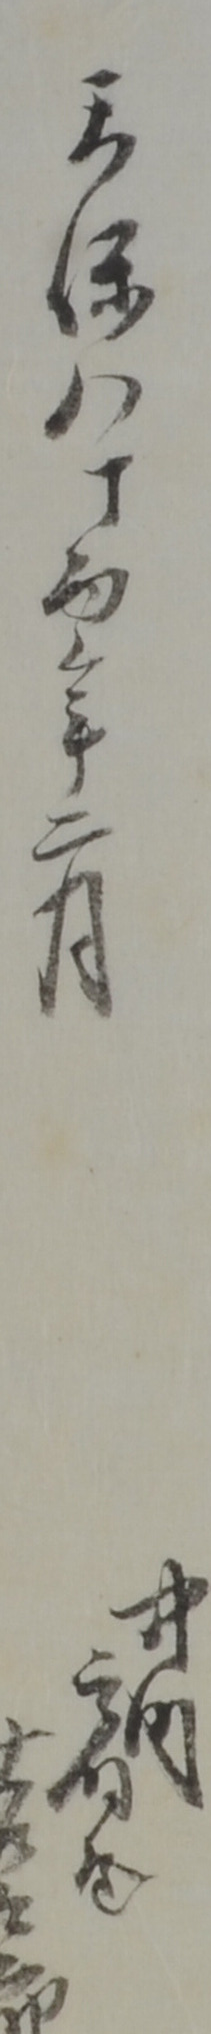天保八丁酉年二月扇屋
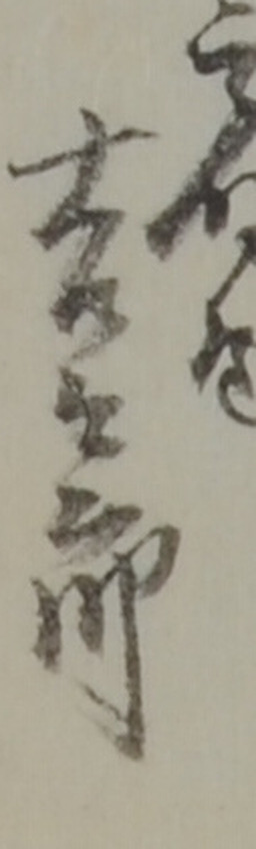吉太郎
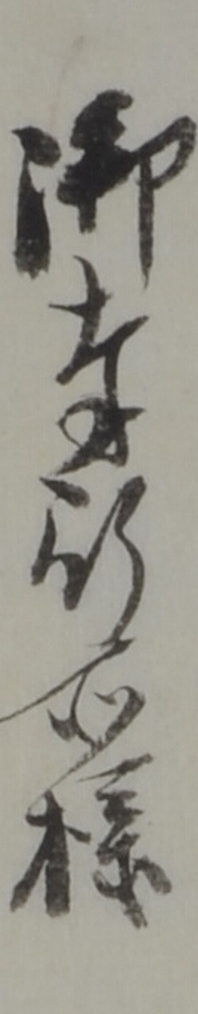御奉行所様
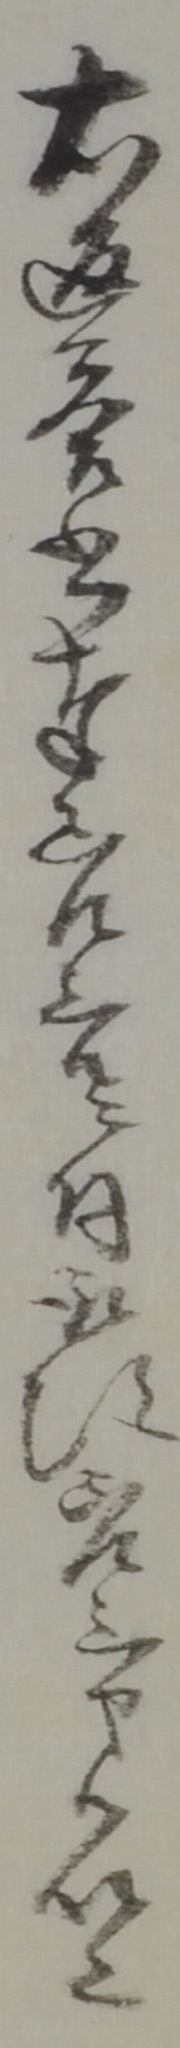右返答書奉差上候ニ付取次差上申候以上
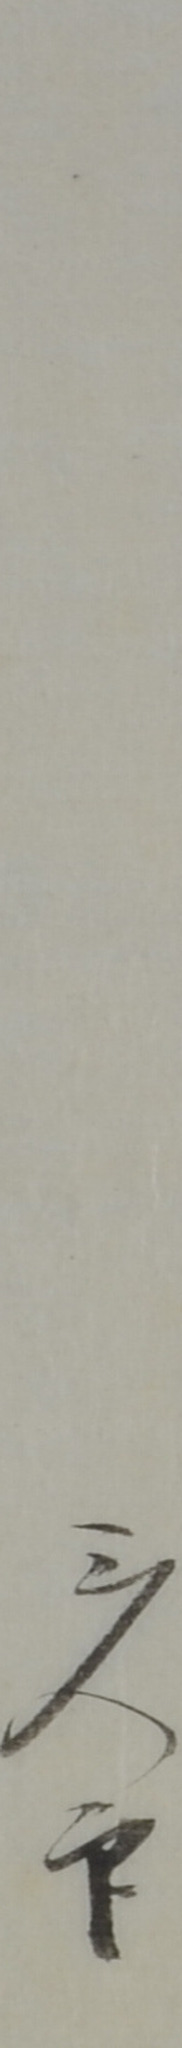三人印
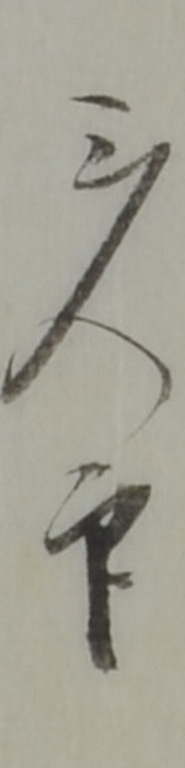三人印
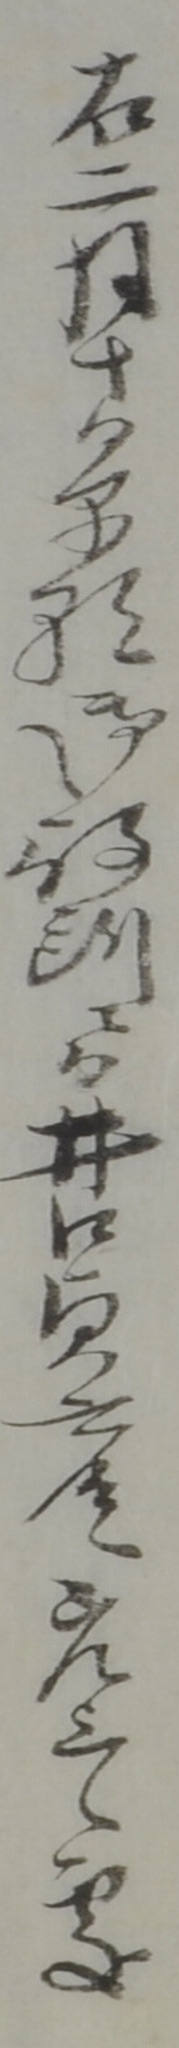右二月十日早朝御役所ニ而井口貞六殿差上候処
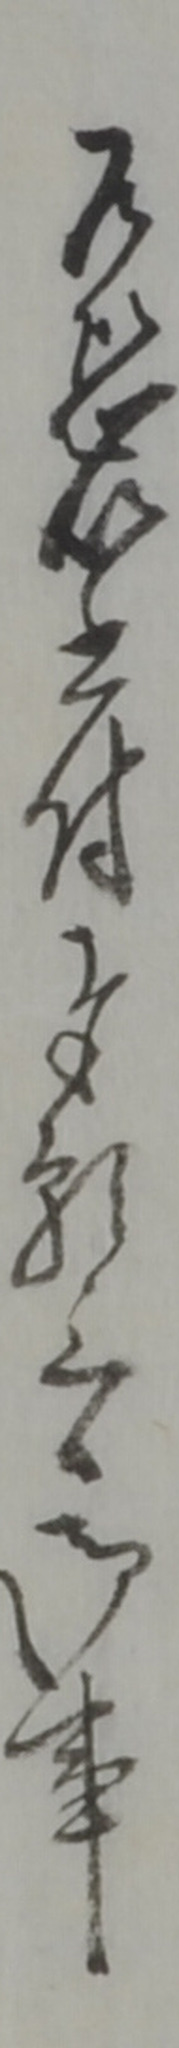乍恐以書付奉願上候御事
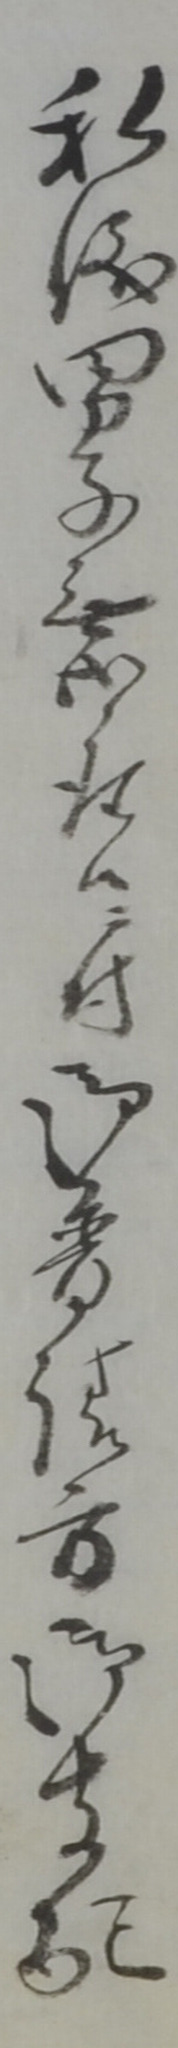私儀男子無御座候ニ付御普請方御支配
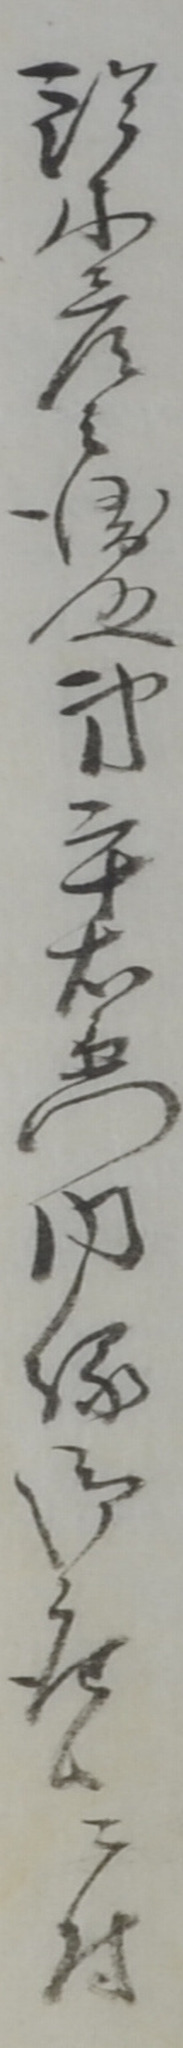鈴木彦兵衛殿弟平右衛門内縁御座候ニ付

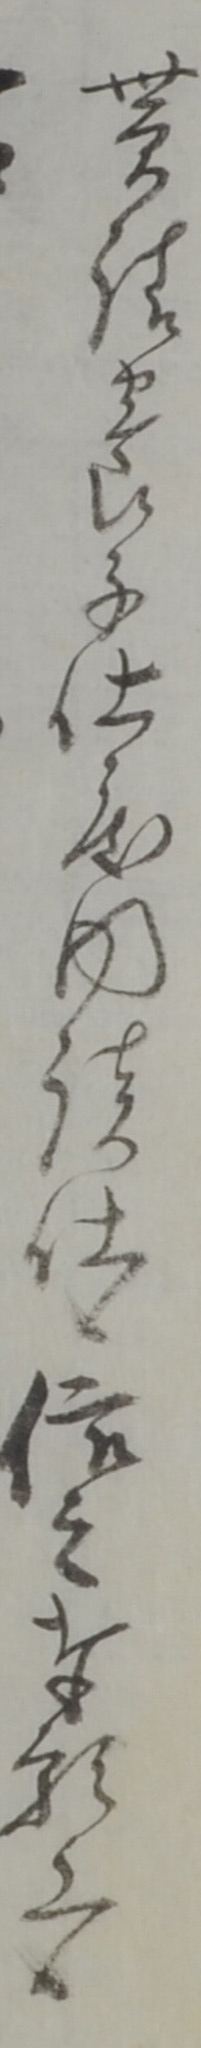貰請養子仕度内談仕候依之奉願上候
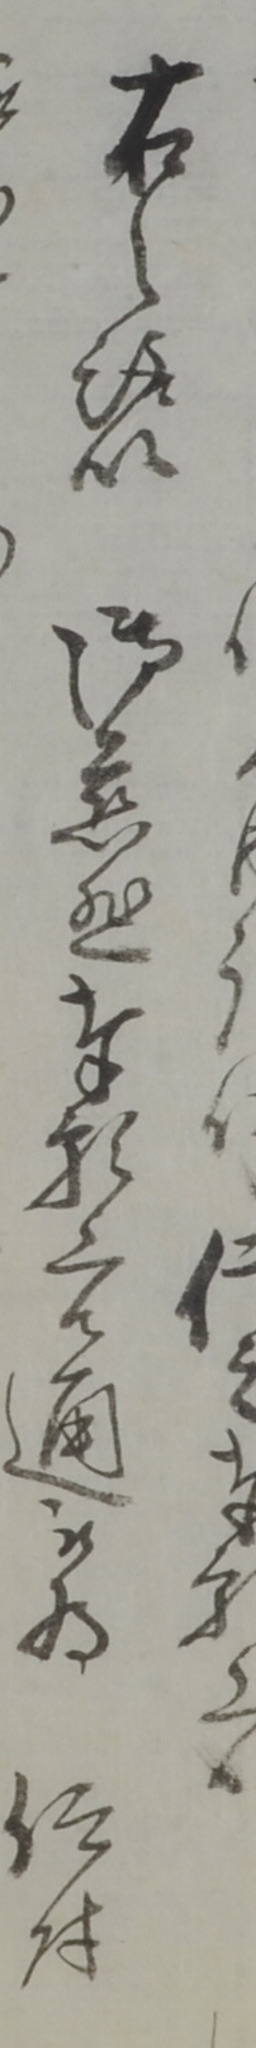右之趣以御慈悲奉願上候通被為仰付
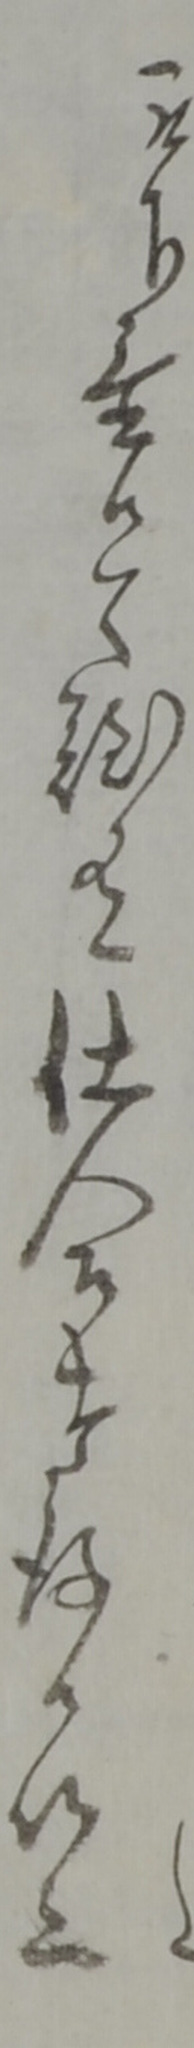被下置候ハヽ難有仕合奉存候以上
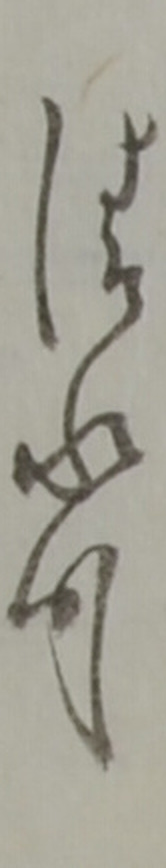清水町
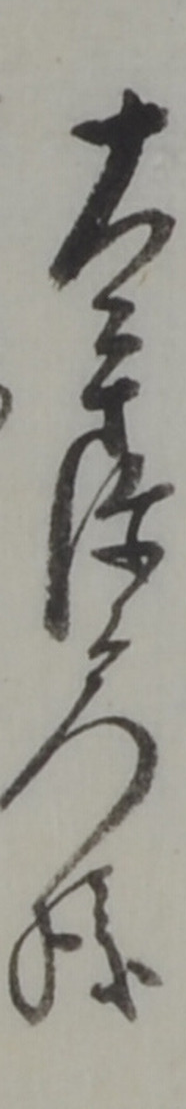大平源右衛門様
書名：諸願書控帳
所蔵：伊那市立高遠町図書館・合同会社AMANE
